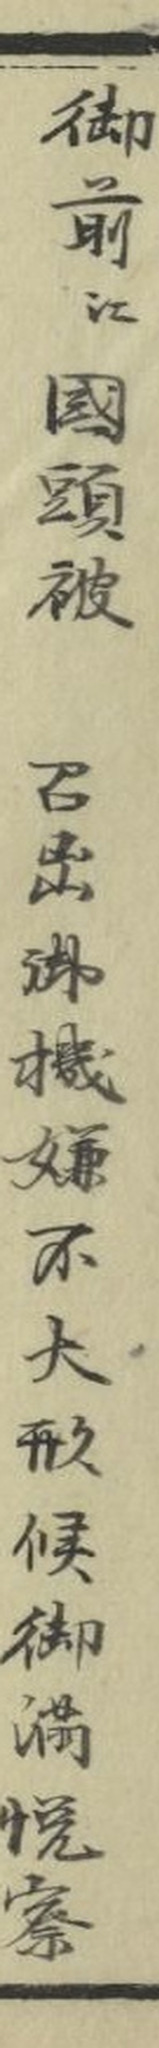御前え国頭披召出御機嫌不大形候御満悦察
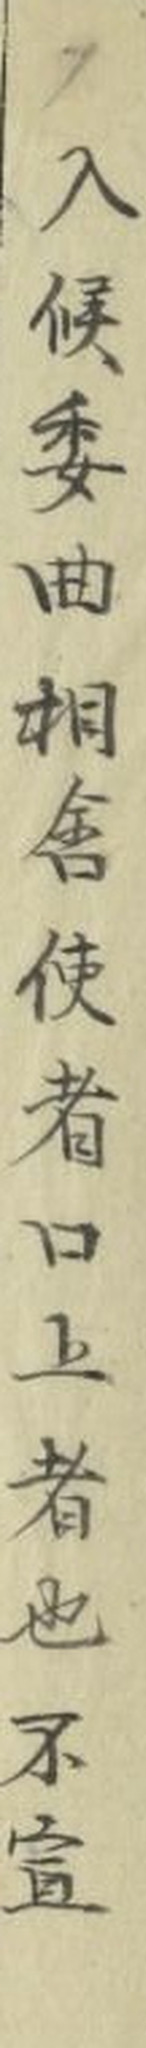入候委曲相含使者口上者也不宣
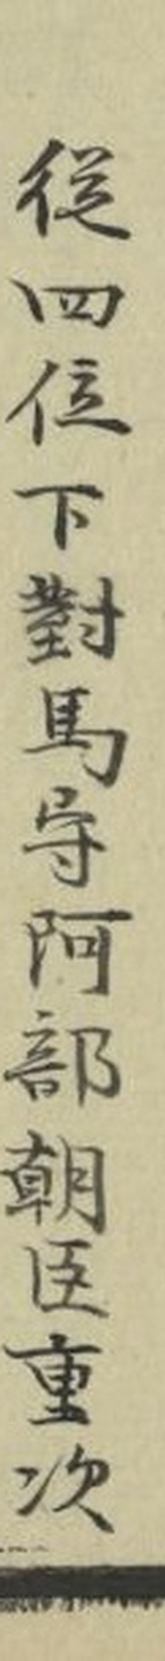従四位下對馬守阿部朝臣重次
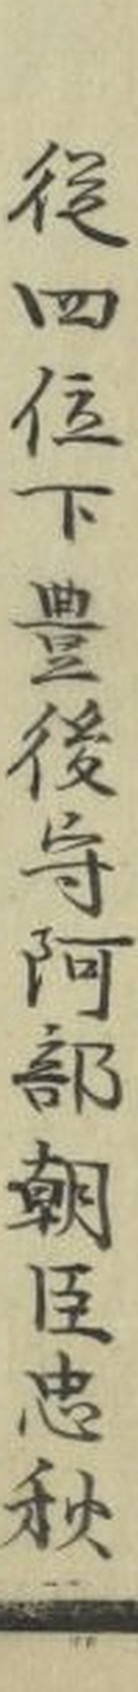従四位下豊後守阿部朝臣忠秋
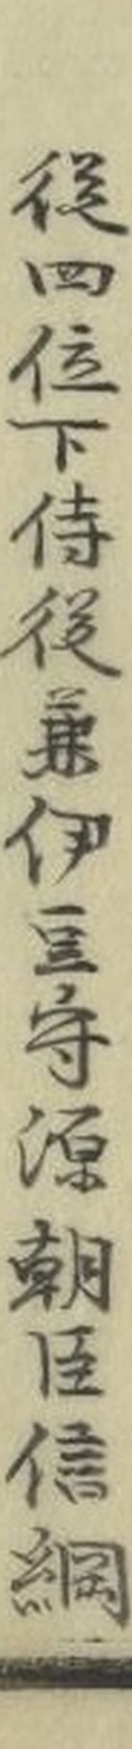従四位下侍従兼伊豆守源朝臣信綱
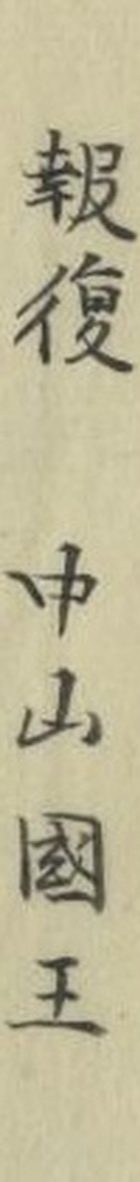報復中山国王
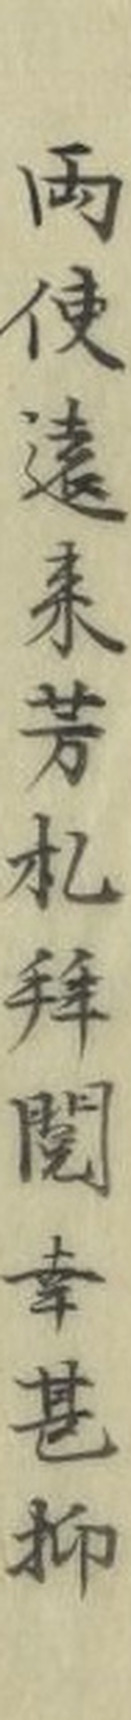両使遠来法礼芳礼拝閲幸甚抑
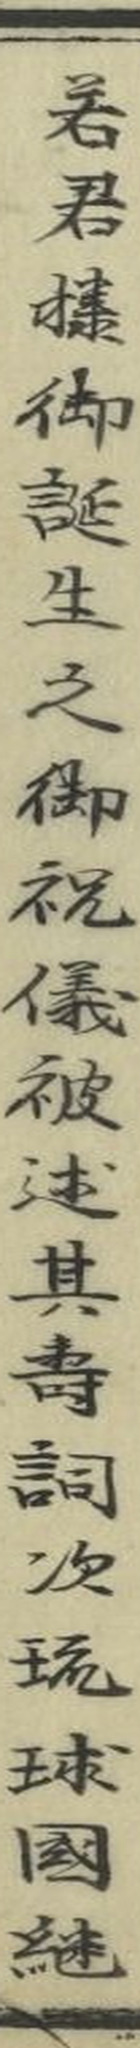若君様御誕生之御祝儀被述其寿詞次琉球国継
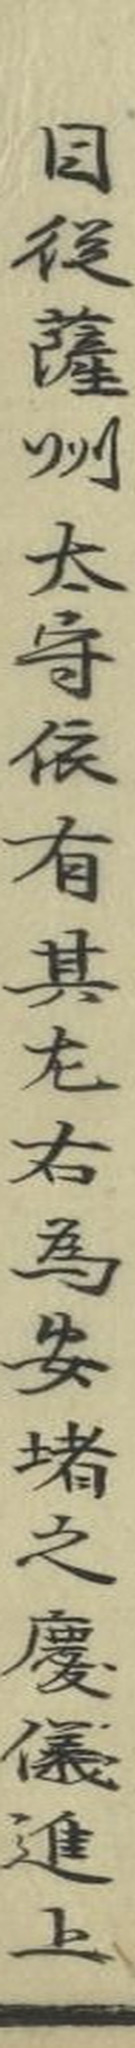目従薩州太守依有其左右為安堵之慶儀進上

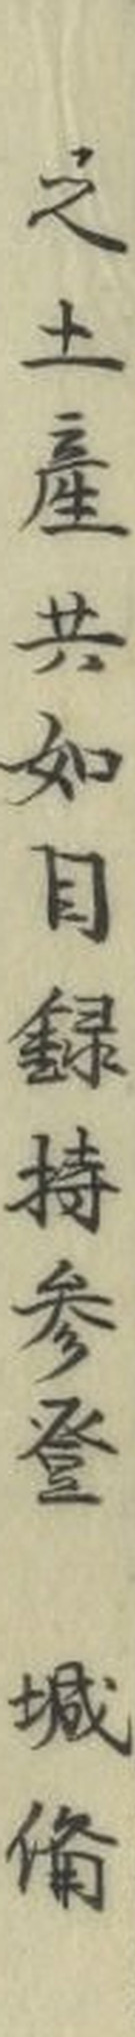之土産共如目録持参登城偏
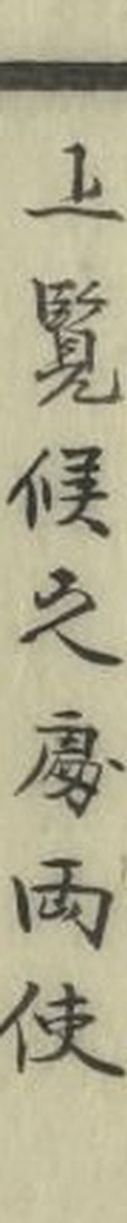上覧候之處両使
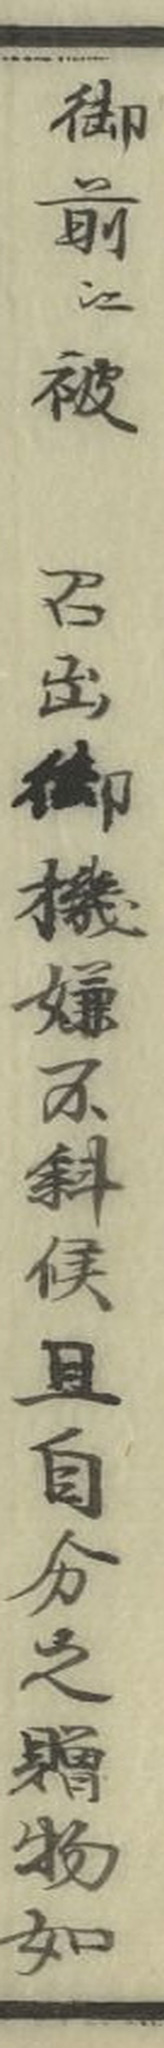御前え被召出御機嫌不斜候且自分之贈物如
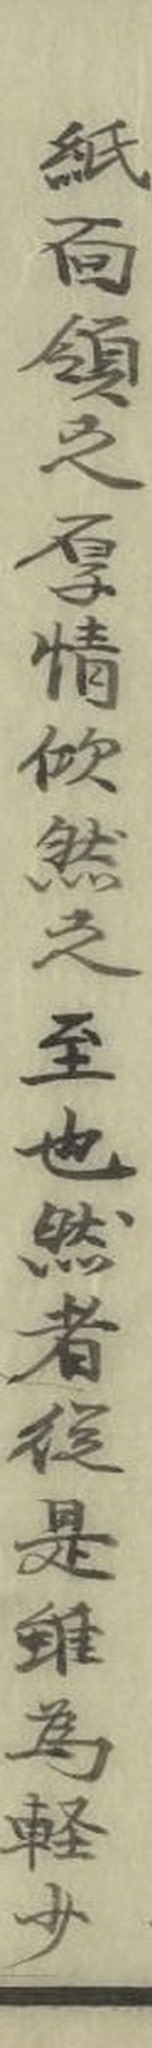紙面領之厚情佽然之至也然者従是雖為軽少
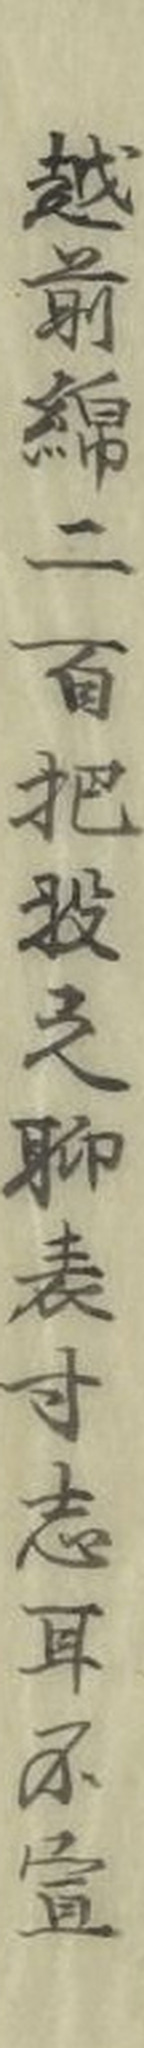越前綿二百把投之聊表寸志耳不宣
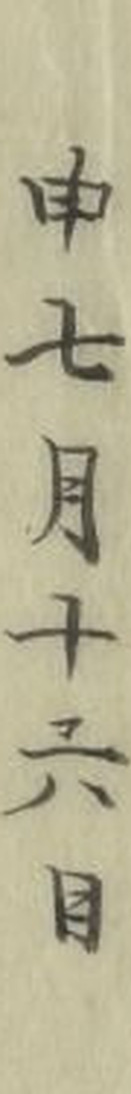申七月十六日
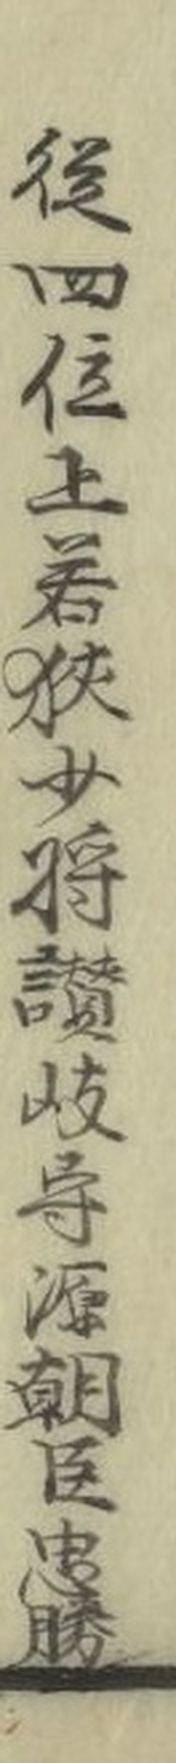従四位上若狭少将讃岐守源朝臣忠勝
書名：琉球往来（上）
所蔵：University of the Ryukyus Library
